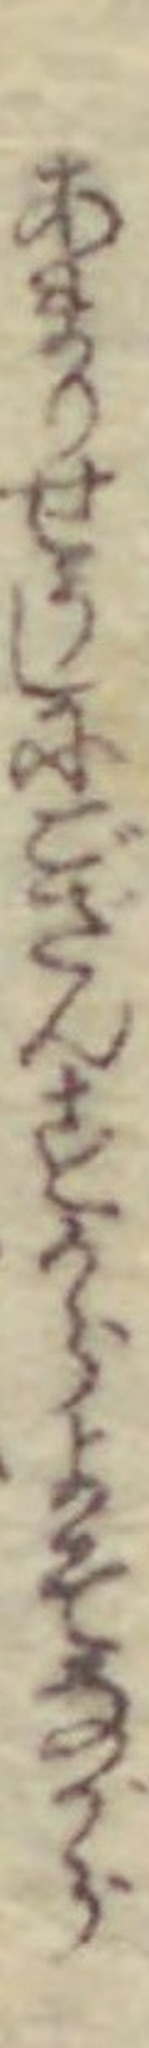あまりせうしにござんすからよそながら
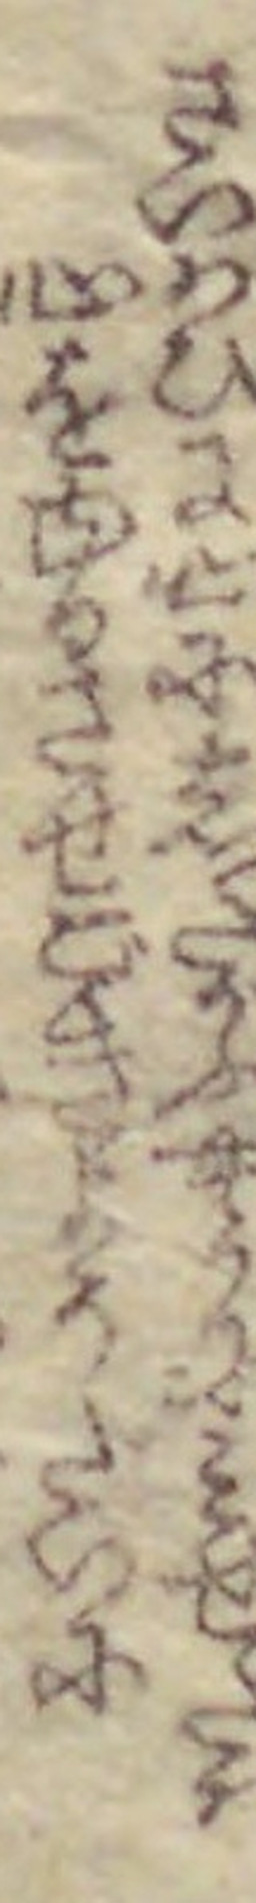心をゆるさせごきようだいに
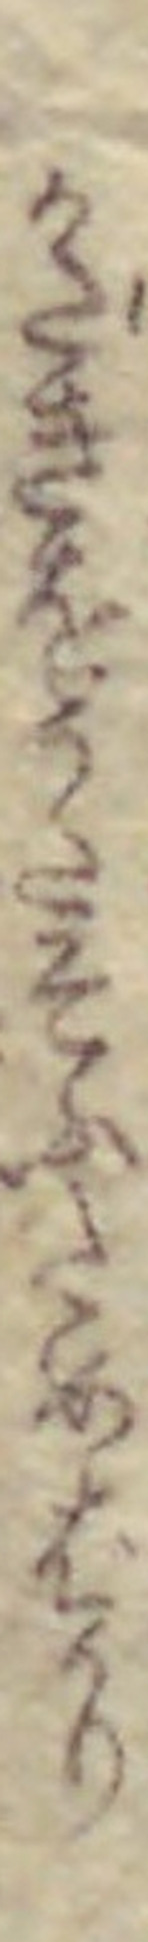かたきをうたそふためばかり
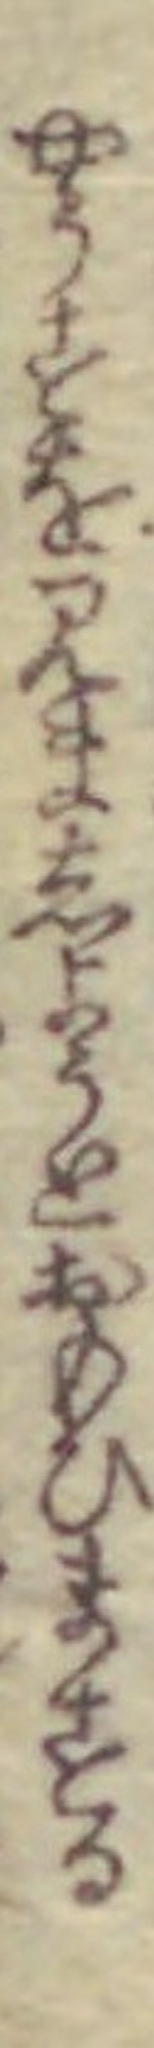やうすを見ましようとおもひまする
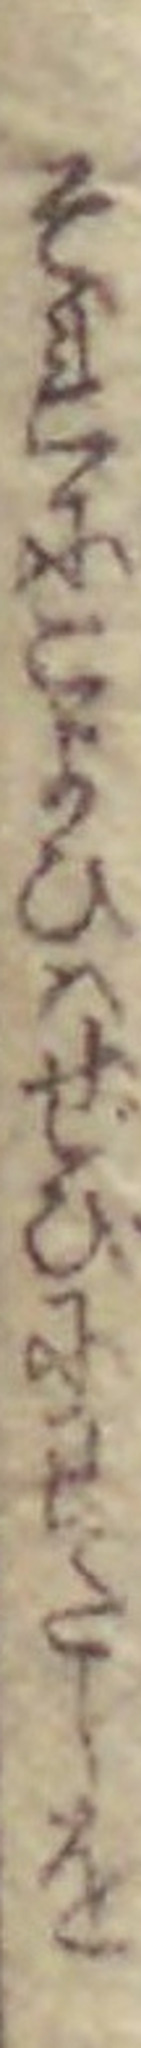それにこよひはぜひにわたくしを
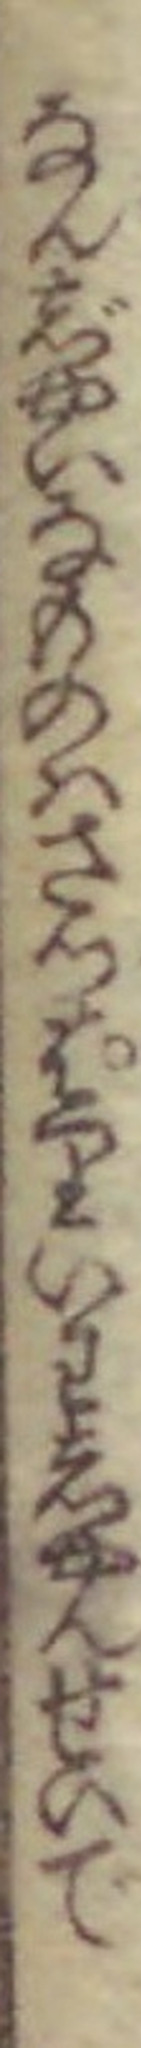なんじやいなものはさつぱりいわしやんせいで
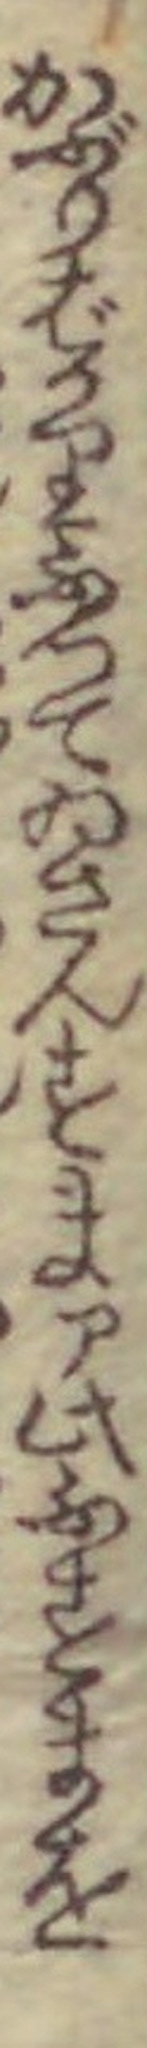かぶりばかりふつてゐさんすまァ此ふすまを
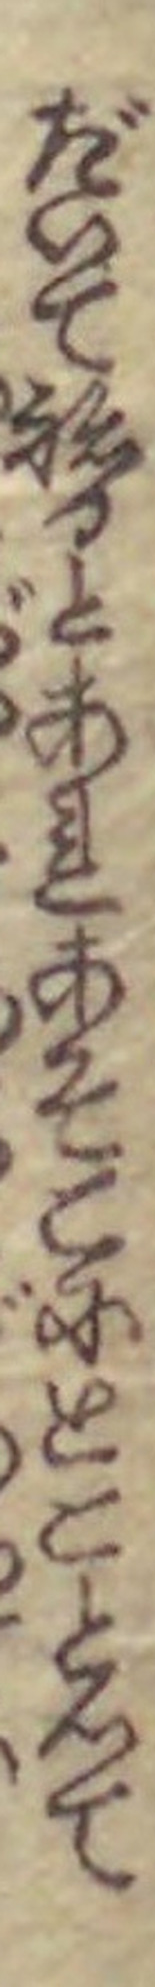だいてねるとあれあそこにとことつて
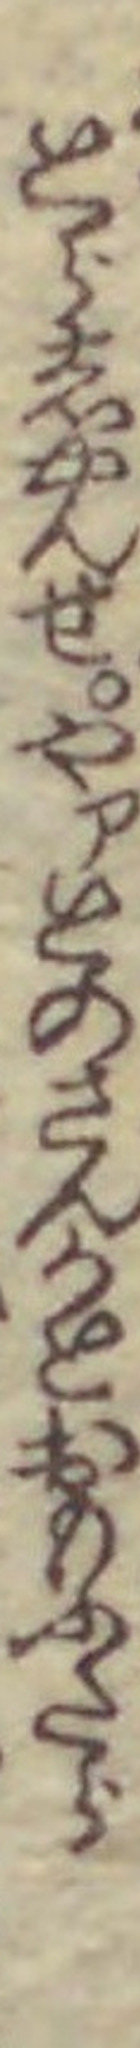とらしやんせ。やァとのさんかとおもふたら
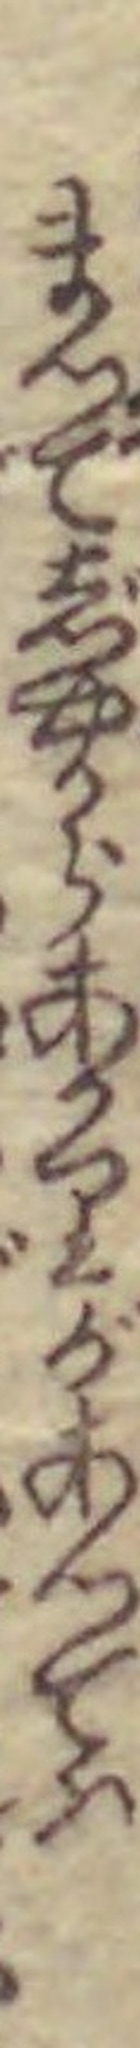まつてじやからあかりがあつては
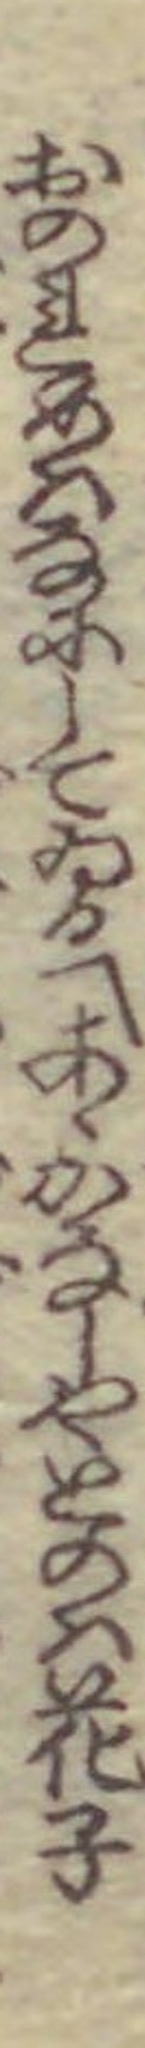おのれめはなにしてゐる〽あゝかなしやとのは花子
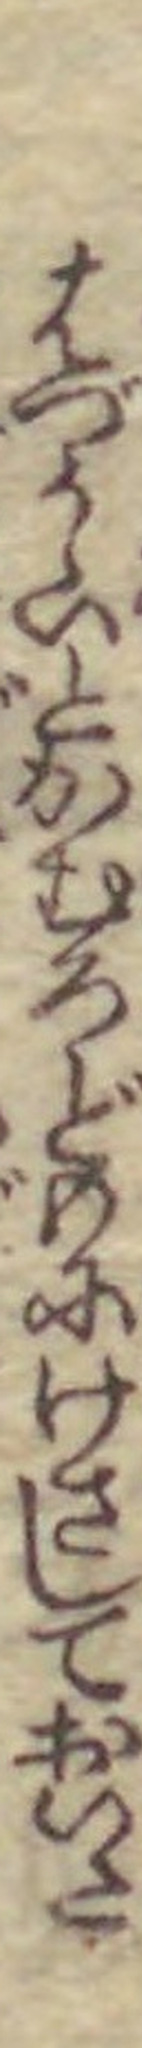はづかしいとかむろどのにけさしておいた
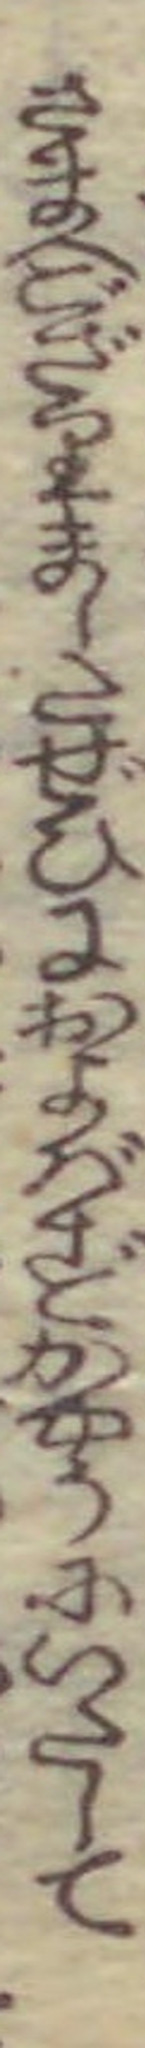さまへござりましたぜひおよばずかやうにいたして
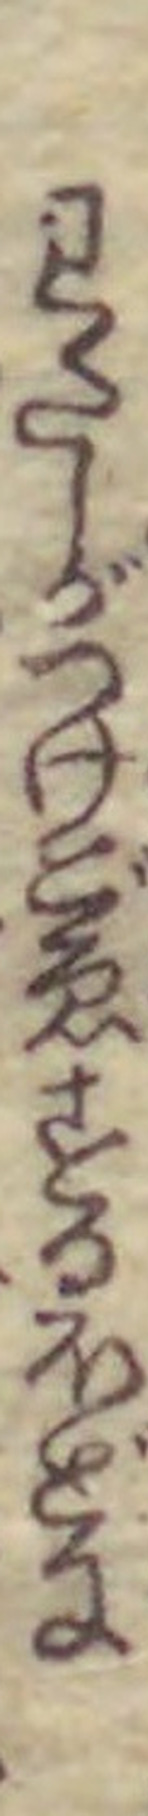わたしがつけごゑするほどに
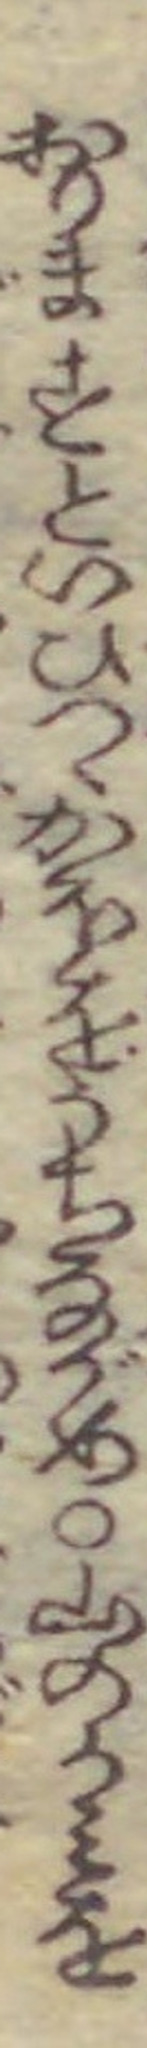おりますとおひつゝかほをうちながめ○山のかみを
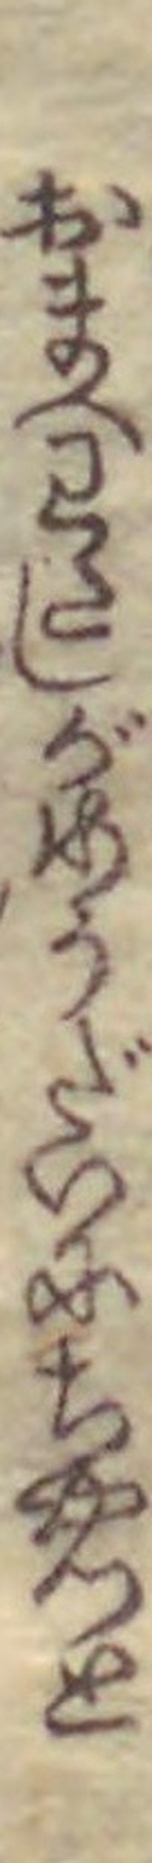おまへわたしがめうだいにちやつと
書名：大時代唐土化物 3巻. 曽我太夫染
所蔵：国立国会図書館 National Diet Library, JAPAN
